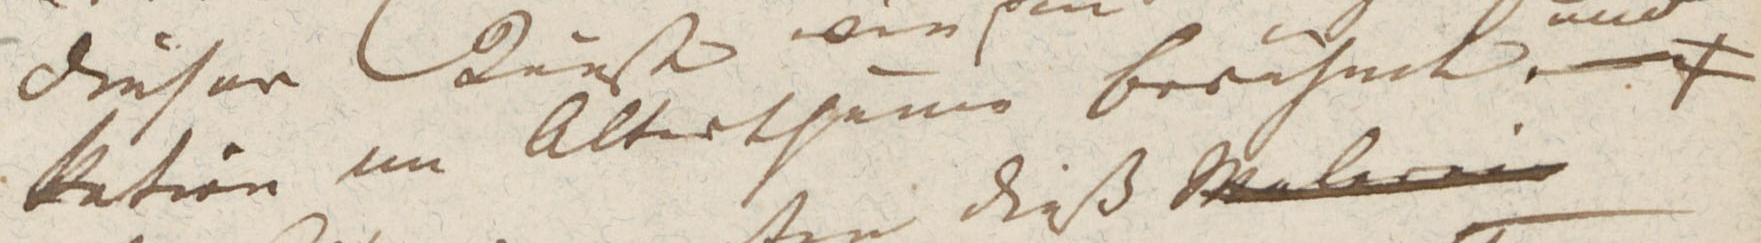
kation im Alterthume berühmt. und %
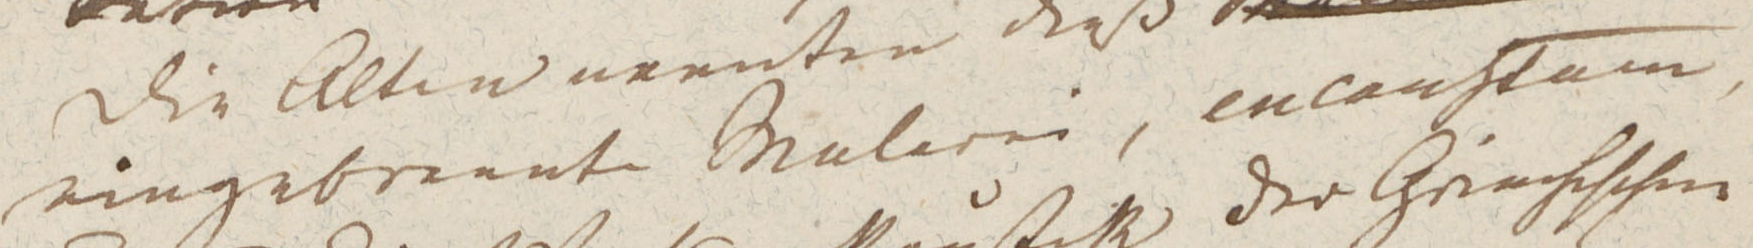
eingebrannte Malerei, encaustum,
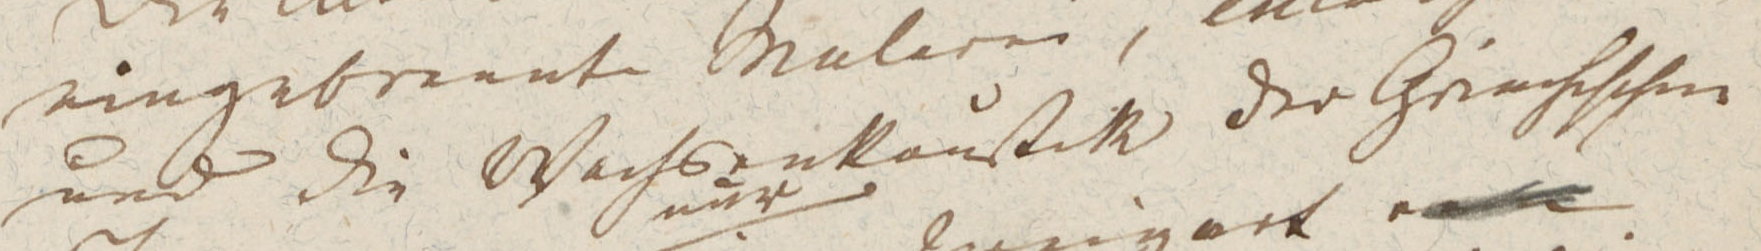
und die Wachsenkaustik der Griechischen
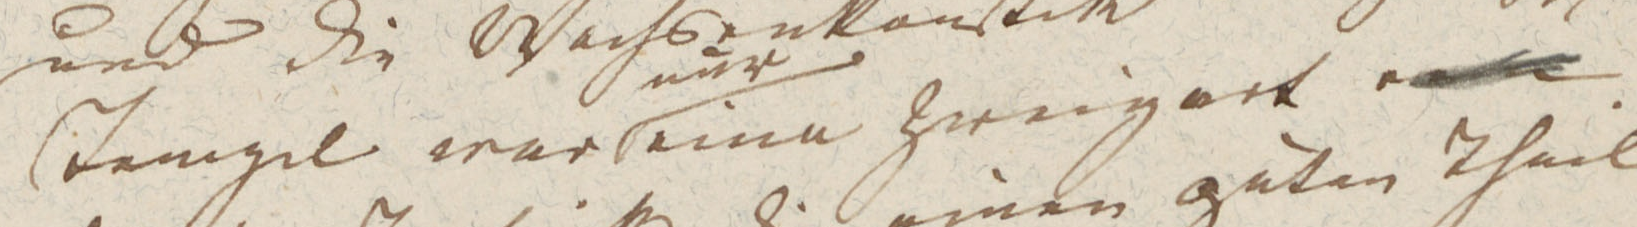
Tempel war nur eine Zweigart von
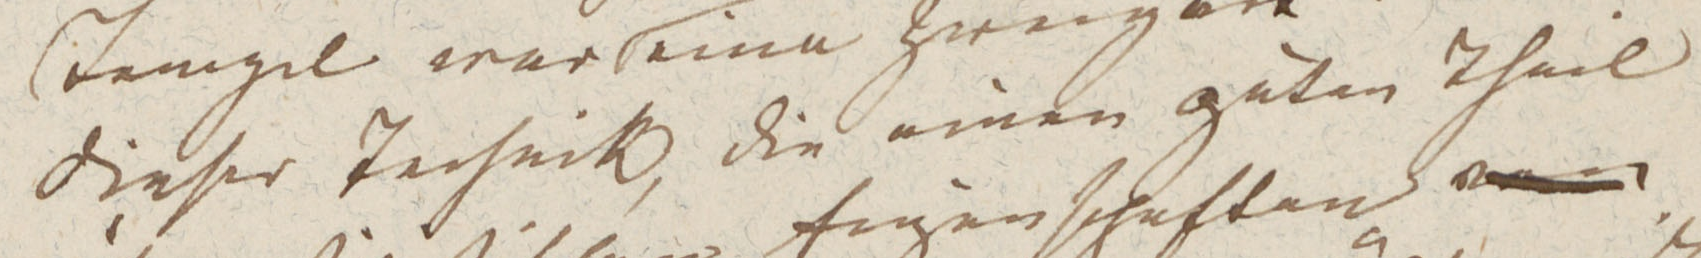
dieser Technik, die einen guten Theil
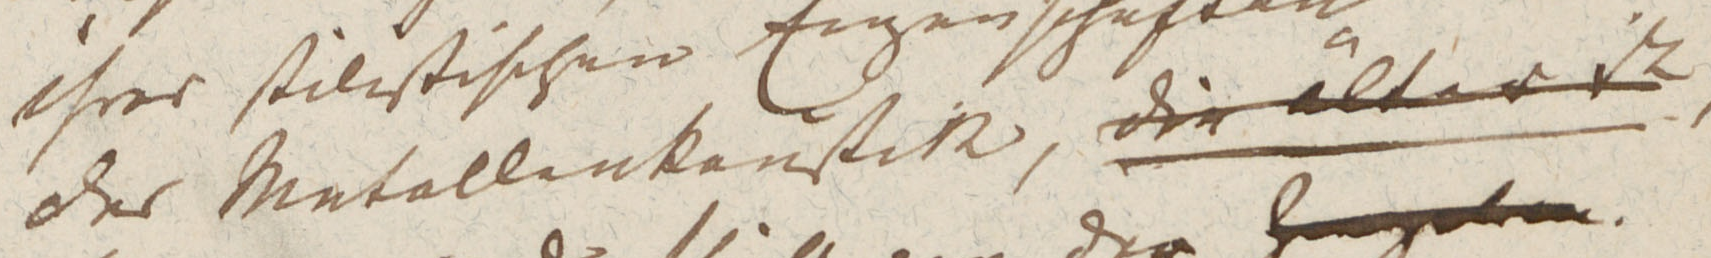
der Metallenkaustik, die älter ist,
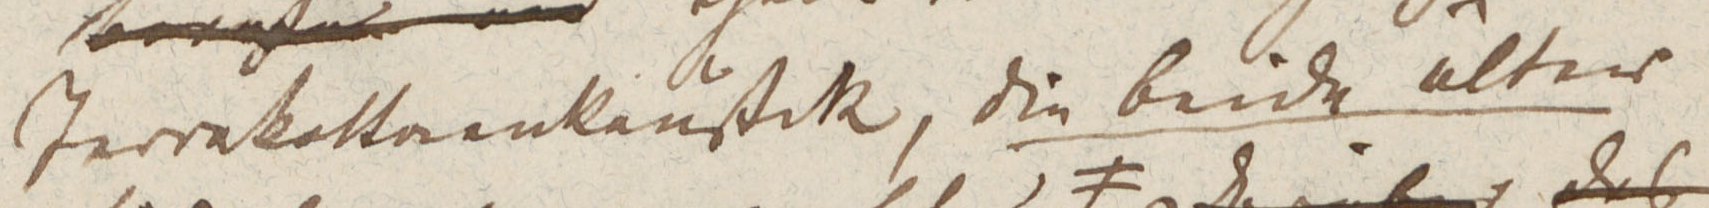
Terrakottaenkaustik, die beide älter
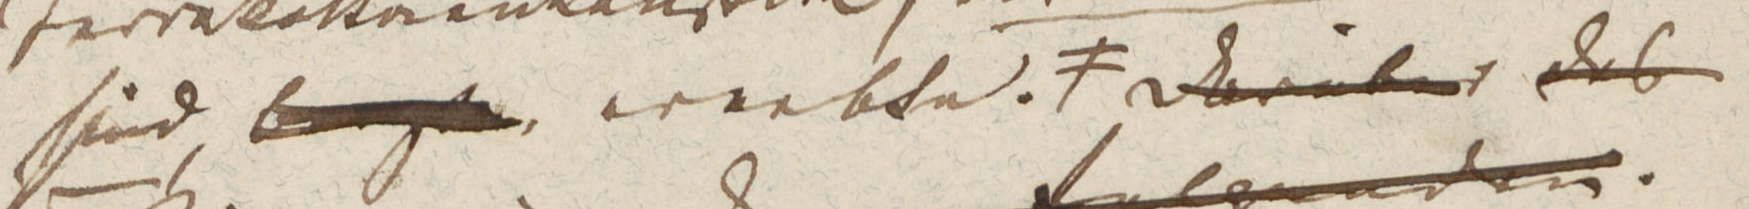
sind, ererbte. % Darüber das
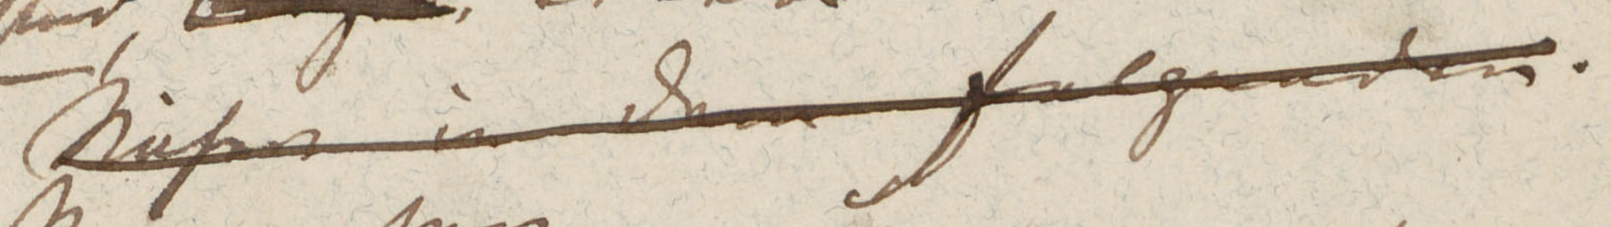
Nähere in dem folgenden
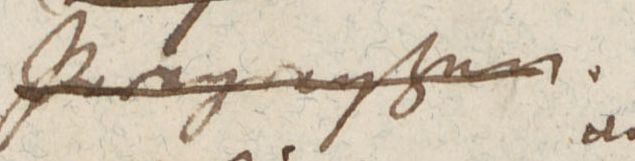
Paragraphen.
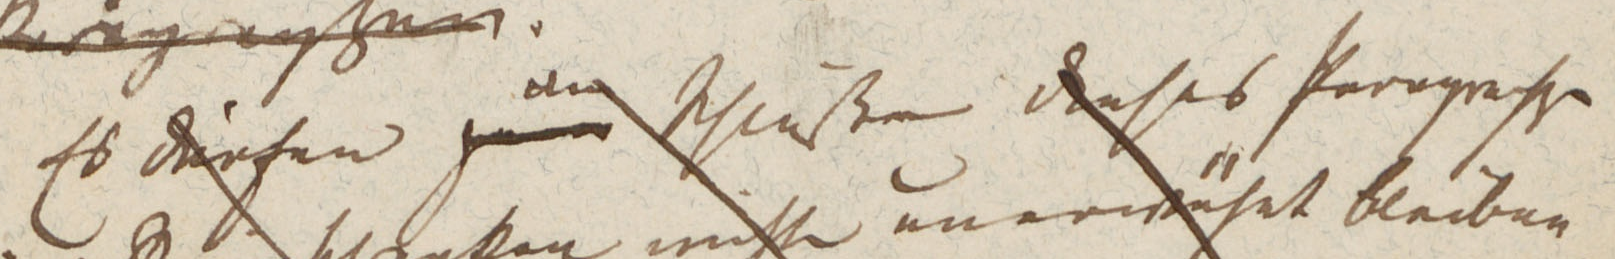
Es dürfen zum am Schlusse dieses Paragraph
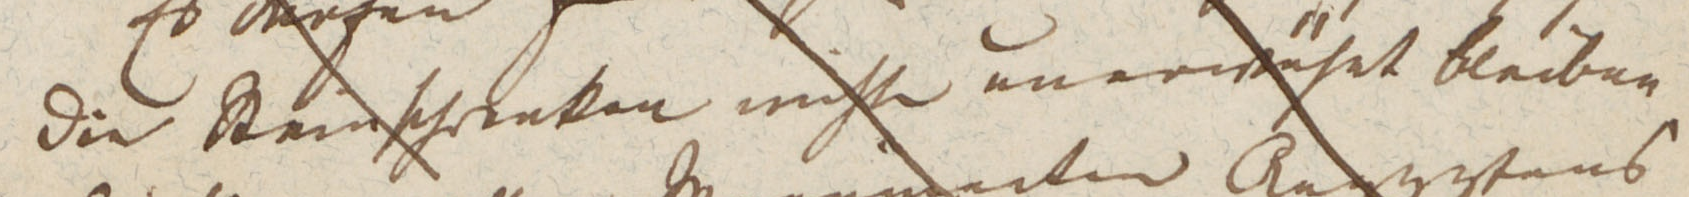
die Steinschranken nicht unerwähnt bleiben
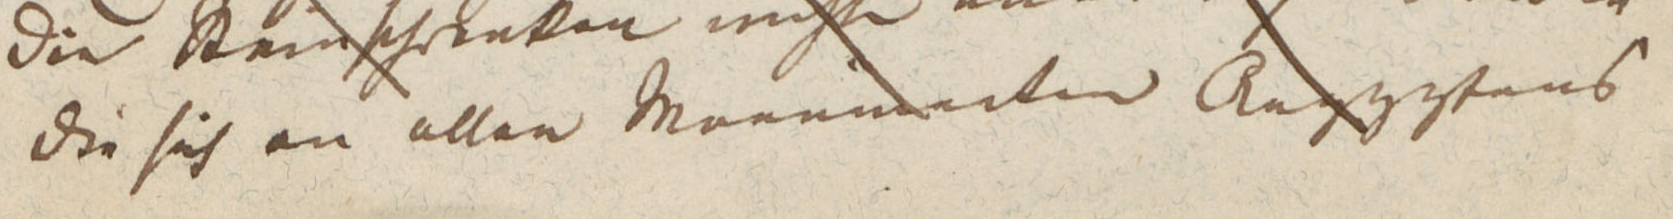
die sich an allen Monumenten Aegyptens
